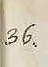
36.
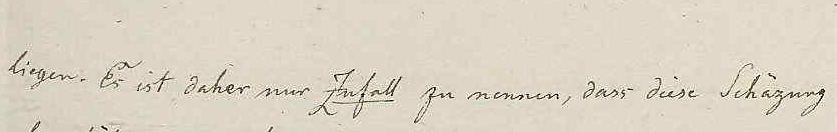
liegen. Es ist daher nur Zufall zu nennen, dass diese Schäzung
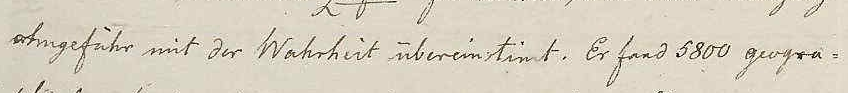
ohngefähr mit der Wahrheit übereinstimmt. Er fand 5800 geogra-
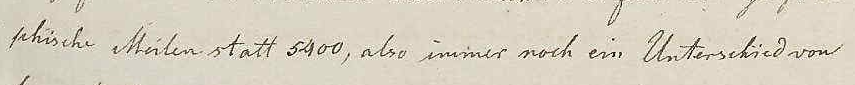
phische Meilen statt 5400, also immer noch ein Unterschied von
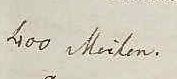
400 Meilen.
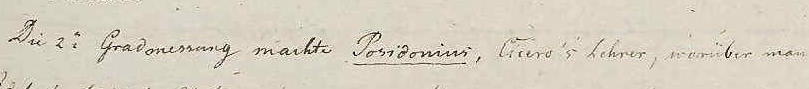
Die 2￼ Gradmessung machte Posidonius, Ciceros Lehrer, worüber man
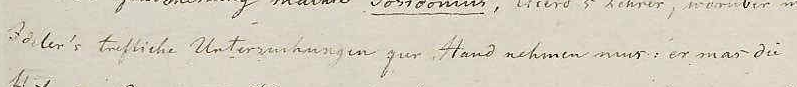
Ideler's trefliche Untersuchungen zur Hand nehmen mus: er mas die
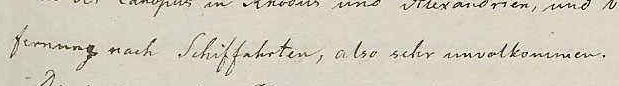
fernung nach Schiffahrten, also sehr unvolkommen.
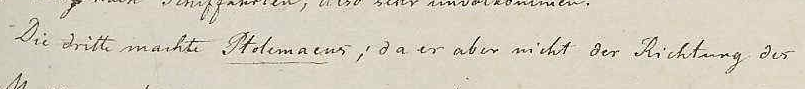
Die dritte machte Ptolemaeus; da er aber nicht der Richtung des
